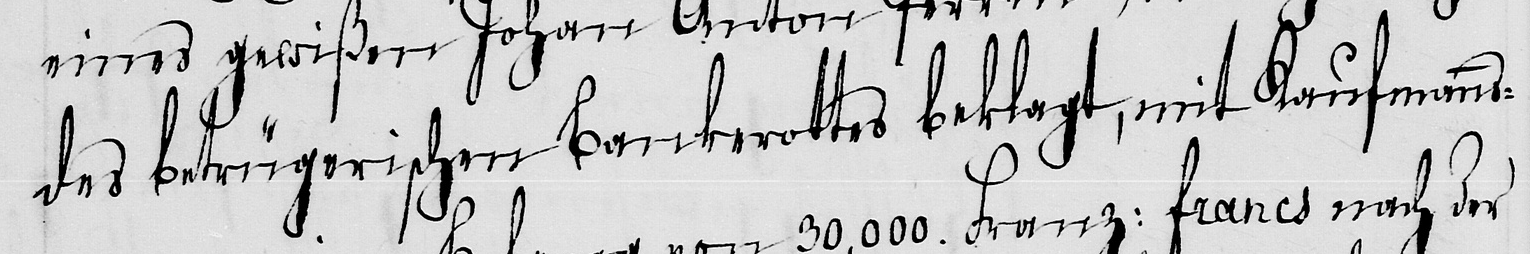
des betrügerischen Bankerottes beklagt, mit Kaufmanns¬
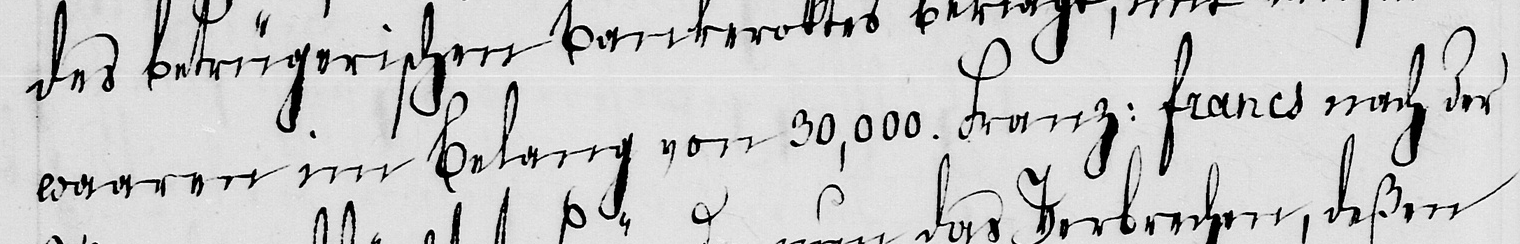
waaren im Belang von 30,000. Franz: francs nach der
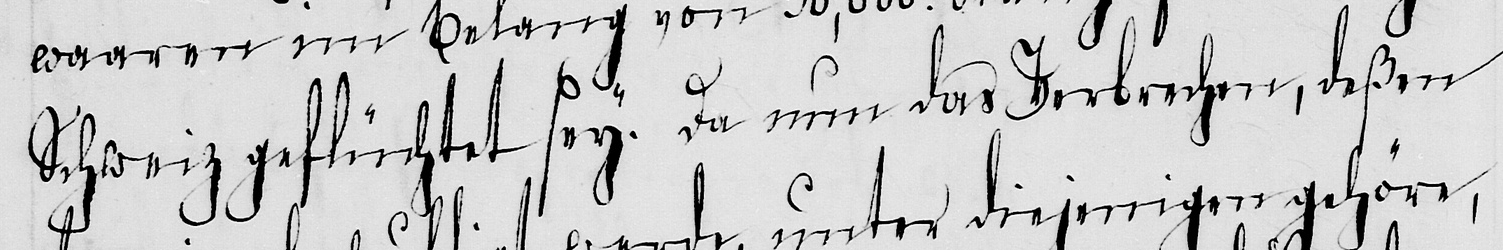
Schweiz geflüchtet sey. Da nun das Verbrechen, deßen
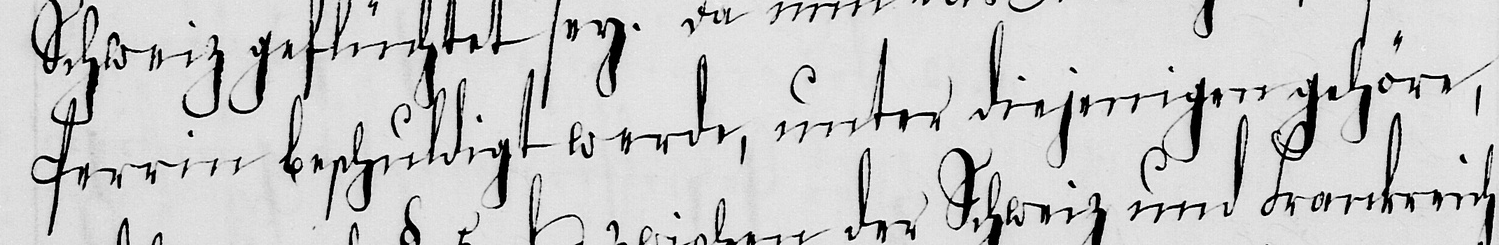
Perrin beschuldigt werde, unter diejenigen gehöre,
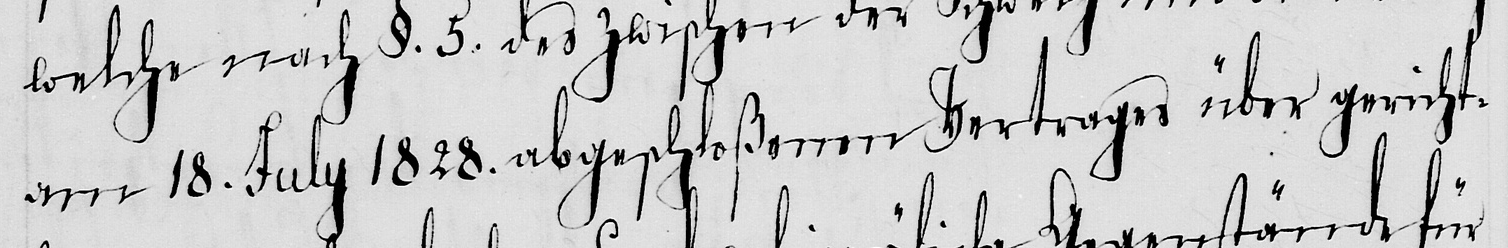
am 18. July 1828. abgeschloßenen Vertrages über gericht¬
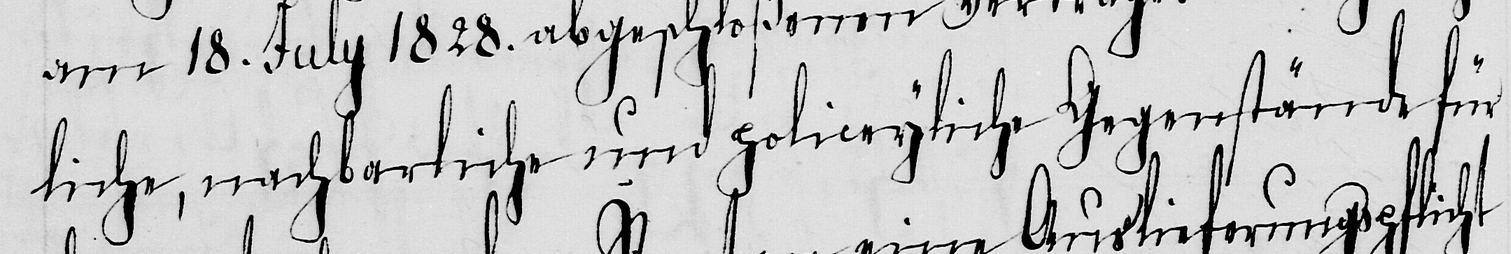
liche, nachbarliche und policeyliche Gegenstände für
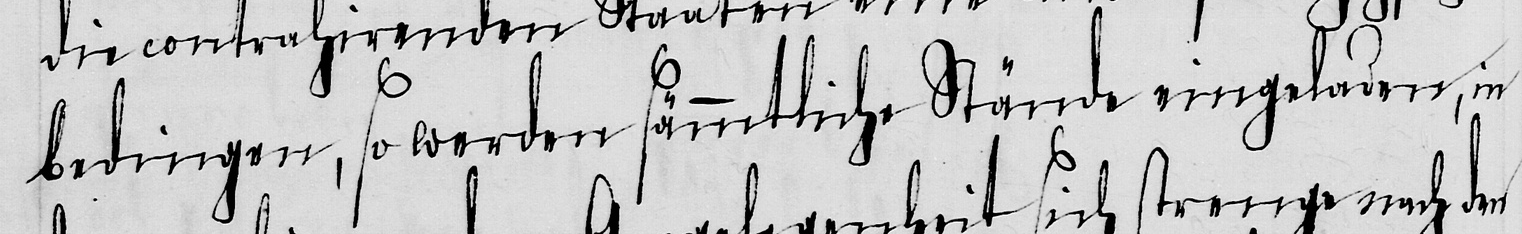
bedingen, so werden sämmtliche Stände eingeladen, in
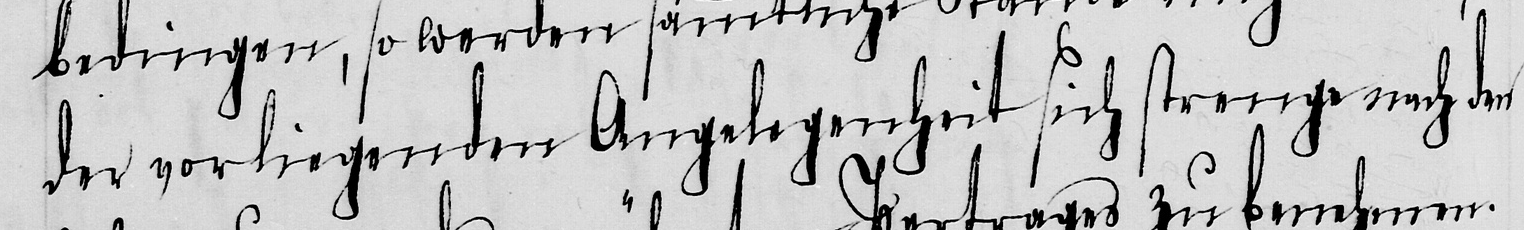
der vorliegenden Angelegenheit sich strenge nach d¬
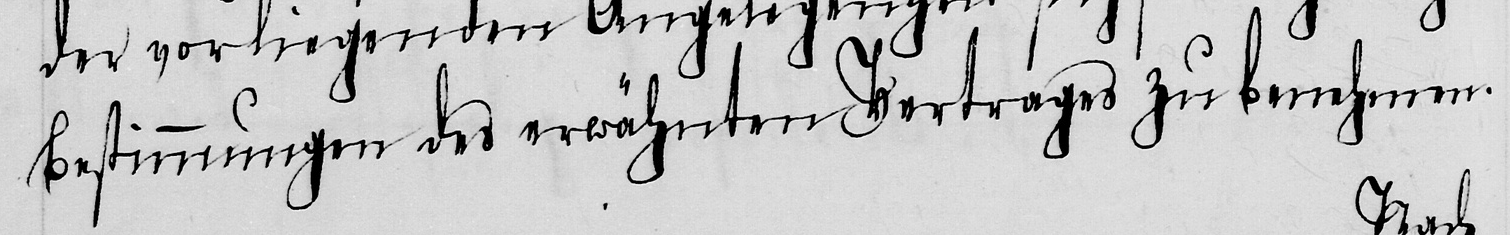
Bestimmungen des erwähnten Vertrages zu benehmen.
